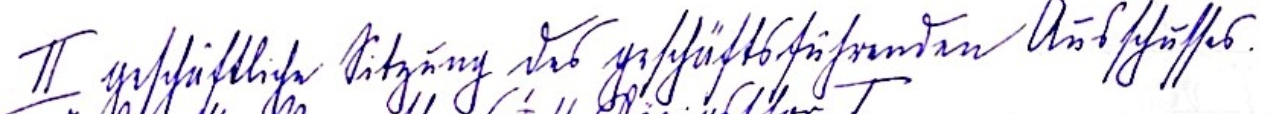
II. geschäftliche Sitzung des geschäftsführenden Ausschusses
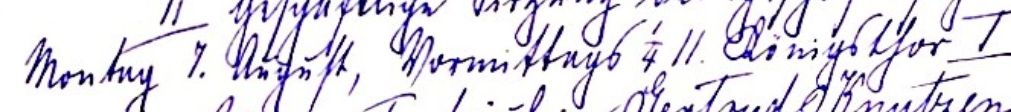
Montag 7. August, Vormittags ¼ 11 Königsthor I
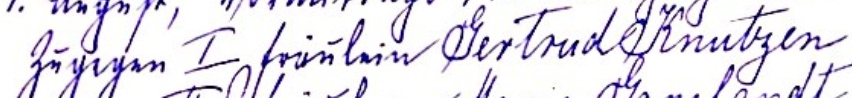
Zugegen: I. Fäulein Gertrud Knutzen
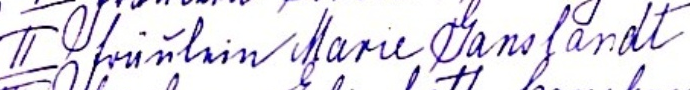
II. Fräulein Marie Ganslandt
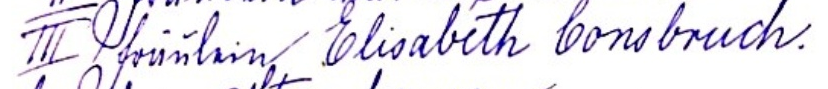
III. Fräulein Elisabeth Consbruck
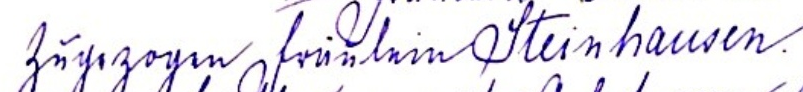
Zugezogen Fräulein Steinhausen
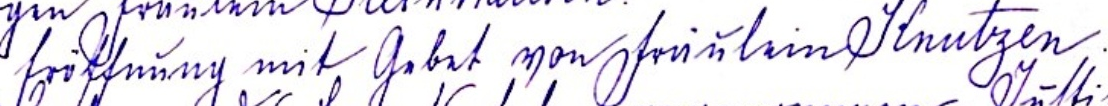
Eröffnung mit Gebet von Fräulein Knutzen
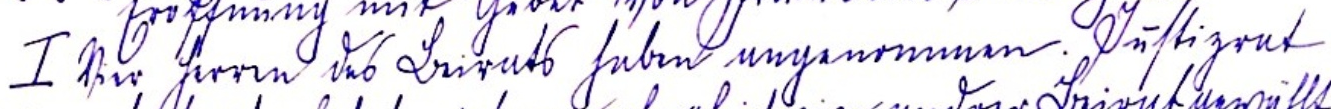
I. Die Herren des Beirats haben angenommen. Justizrat
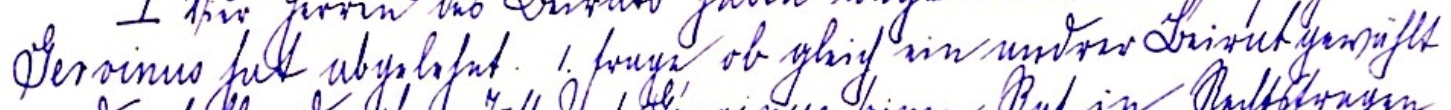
Servinus hat abgelehnt. I. Frage ob gleich ein anderer Beirat gewählt
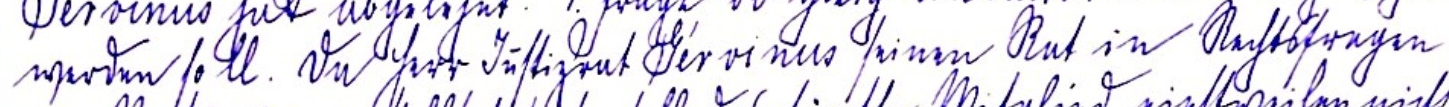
werden soll. Da Herr Justizrat Servinus seinen Rat in Rechtsfragen
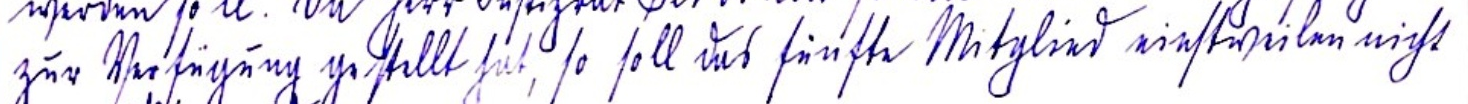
zur Verfügung gestellt hat, so soll das fünfte Mitglied einstweilen nicht
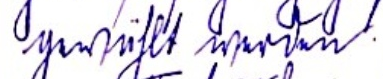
gewählt werden.
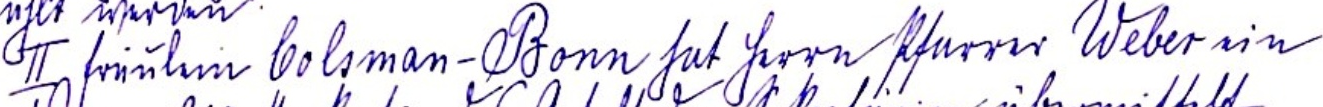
II. Fräulein Colsman-Bonn hat Herrn Pfarrer Weber ein
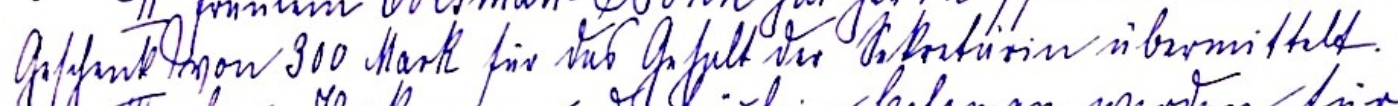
Geschenk von 900 Mark für das Gehalt der Sekretärin übermittelt.
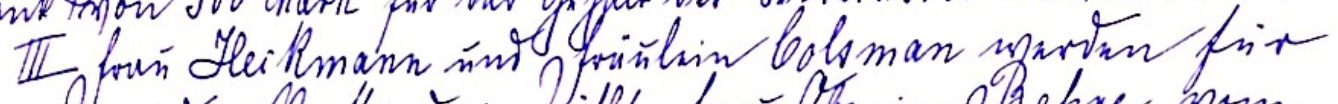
III. Frau Heitmann und Fräulein Colsman werden für
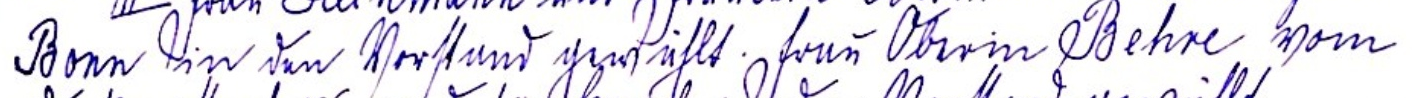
Bonn in den Vorstand gewählt. Frau Oberin Behre vom
